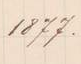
1877.
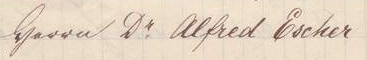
Herrn Dr Alfred Escher
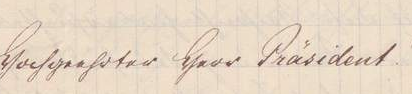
Hochgeehrter Herr Präsident!
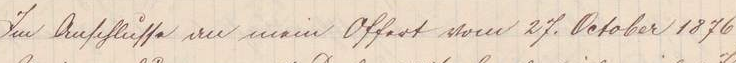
Im Anschlusse an mein Offert vom 27. October 1876 u.
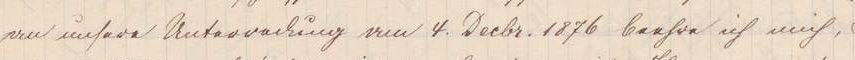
an unsere Unterredung am 4. Decbr. 1876 beehre ich mich,
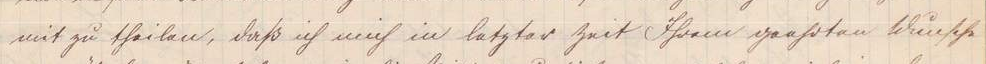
mit zu theilen, daß ich mich in letzter Zeit Ihren geehrtem Wunsche
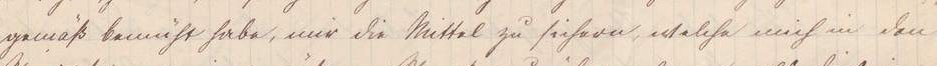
gemäß bemüht habe, mir die Mittel zu sichern, welche mich in den
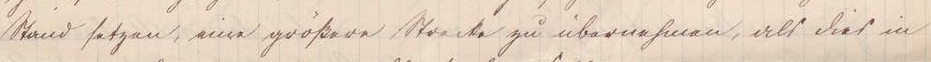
Stand setzen, eine größere Strecke zu übernehmen, als dies in
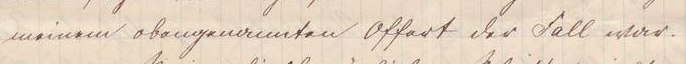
meinem obengenannten Offert der Fall war.
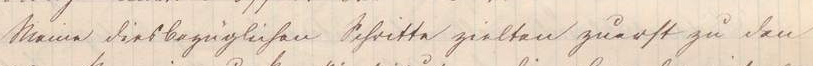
Meine diesbezüglichen Schritte zielten zuerst zu den
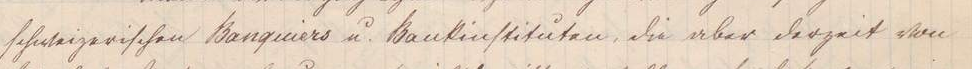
schweizerischen Banquiers u. Bankinstituten, die aber derzeit von
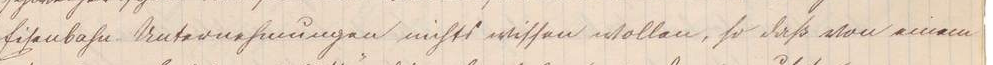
Eisenbahn-Unternehmungen nichts wissen wollen, so daß von einem
